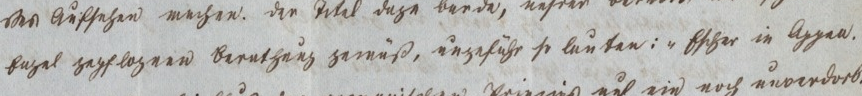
Engel gepflognen Berathung gemäß, ungefähr so lauten: «Escher in Appen-
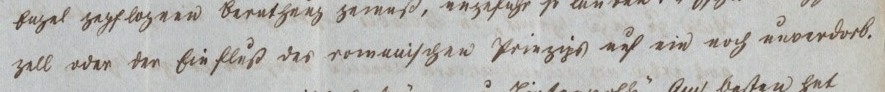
zell oder der Einfluß des romanischen Prinzips auf ein noch unverdorb-
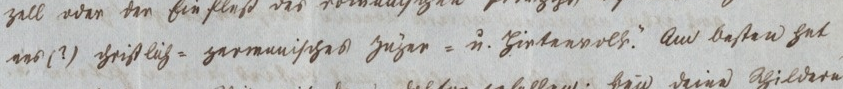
nes (?) christlich-germanisches Jäger- u. Hirtenvolk». Am besten hat
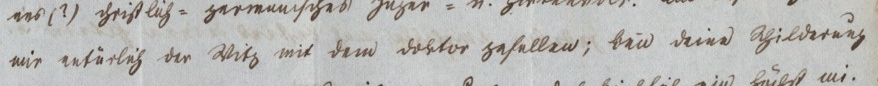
mir natürlich der Witz mit dem Doktor gefallen; wenn deine Schilderung
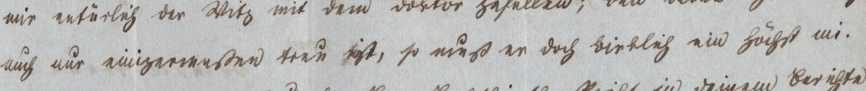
auch nur einigermaßen treu ist, so muß er doch wirklich ein höchst mi-
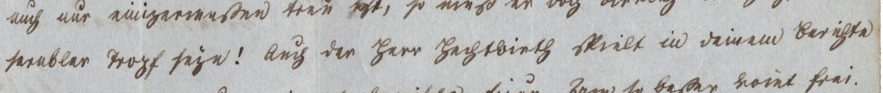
serabler Tropf seyn! Auch der Herr Hechtwirth spielt in deinem Berichte
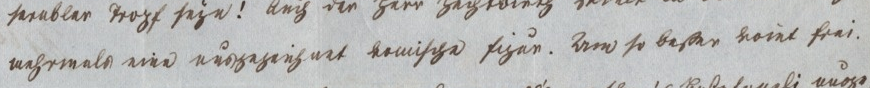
mehrmals eine ausgezeichntet komische Figur. Um so besser kommt frei-
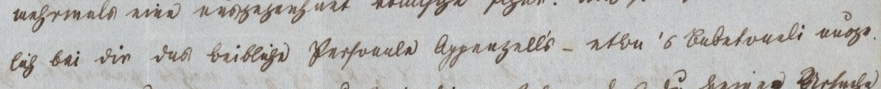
lich bei dir das weibliche Personale Appenzell's – etwa 's Babetoneli ausge-
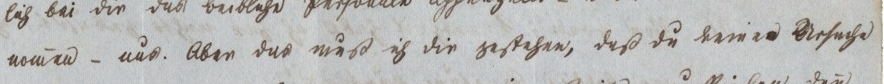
nommen – aus. Aber das muß ich dir gestehen, daß du keine Ursache
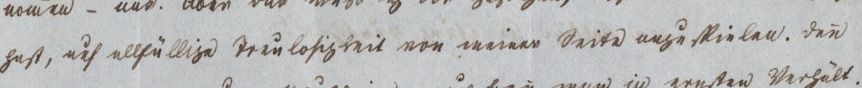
hast, auf allfällige Treulosigkeit von meiner Seite anzuspielen. Denn
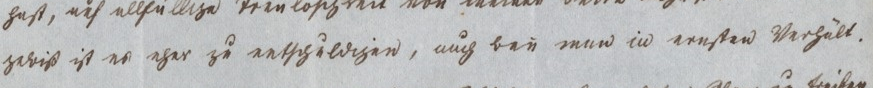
gewiß ist es eher zu entschuldigen, auch wenn man in ernsten Verhält-
